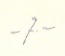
-7.-
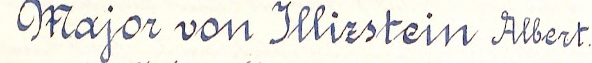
Major von Illizstein Albert.
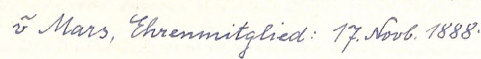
v/o Mars, Ehrenmitglied: 17. Novb. 1888.
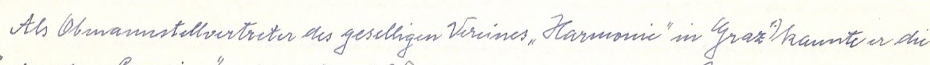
Als Obmannstellvertreter des geselligen Vereins "Harmonie" in Graz1.) kannte er die
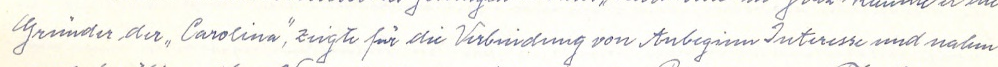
Gründer der "Carolina", zeigte für die Verbindung von Anbeginn Interesse und nahm
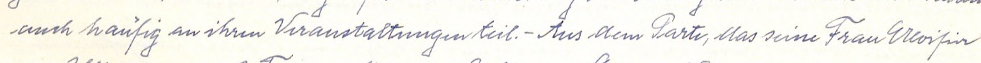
auch häufig an ihren Veranstaltungen teil. - Aus dem Parte, das seine Frau Aloisia
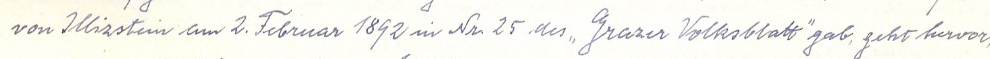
von Illizstein am 2. Februar 1892 in Nr. 25 des "Grazer Volksblatt" gab, geht hervor,
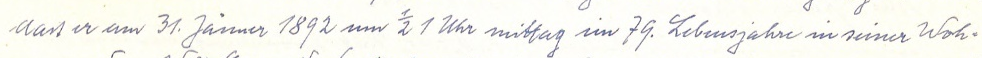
dass er am 31. Jänner 1892 um 1/2 Uhr mittag im 79. Lebensjahr in seiner Woh-
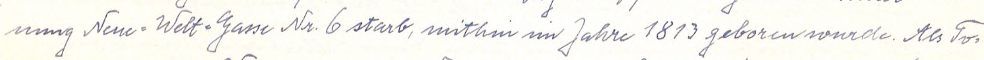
nung Neue-Welt-Gasse Nr. 6 starb, mithin im Jahre 1813 geboren wurde. Als To-
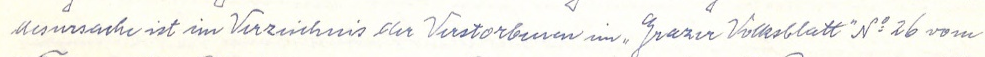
desursache ist im Verzeichnis der Verstorbenen im "Grazer Volksblatt" Nr. 26 vom
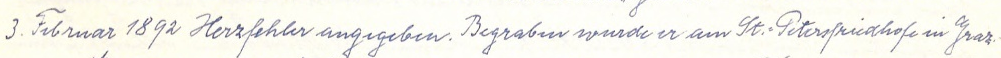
3. Februar 1892 Herzfehler angegeben. Begraben wurde er am St.-Petersfriedhofe in Graz.
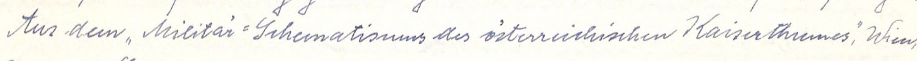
Aus dem "Militär"-Schematismus des österreichischen Kaiserthums, Wien,
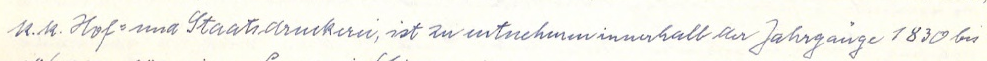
k. k. Hof- und Staatsdruckerei, ist zu entnehmen innerhalb der Jahrgänge 1830 bis
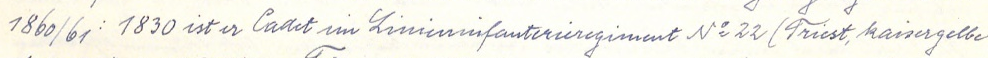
1860/61: 1830 ist er Cadet im Linieninfanterieregiment Nr. 22 (Triest, kaisergelbe
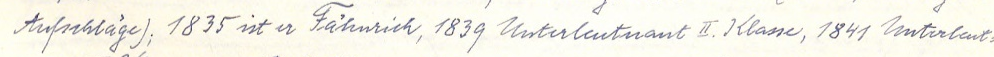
Aufschläge). 1835 ist er Fähnrich, 1839 Unterleutnant II. Klasse, 1841 Unterleut-
